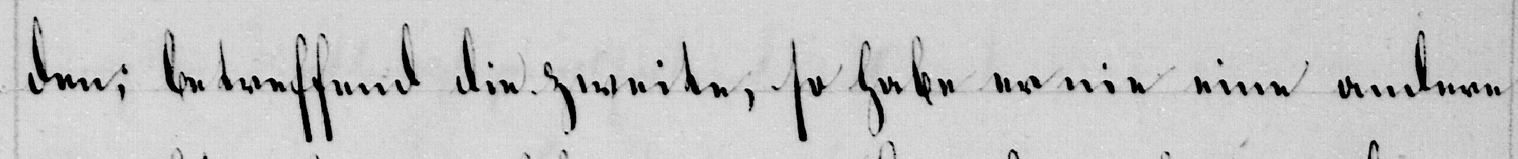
den: betreffend die zweite, so habe er nie eine andere
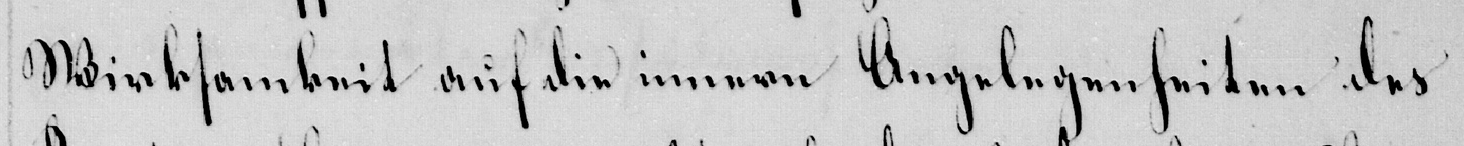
Wirksamkeit auf die innern Angelegenheiten des
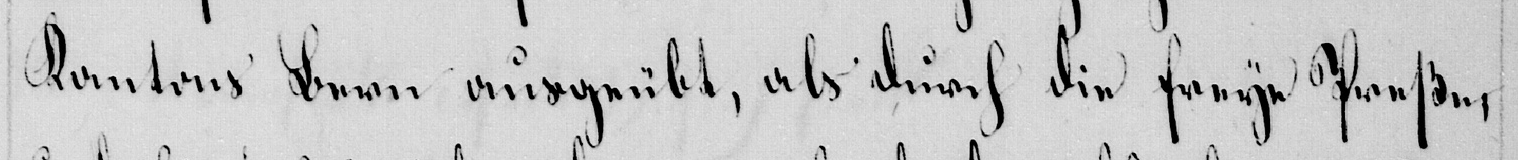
Kantons Bern ausgeübt, als durch die freye Preße;
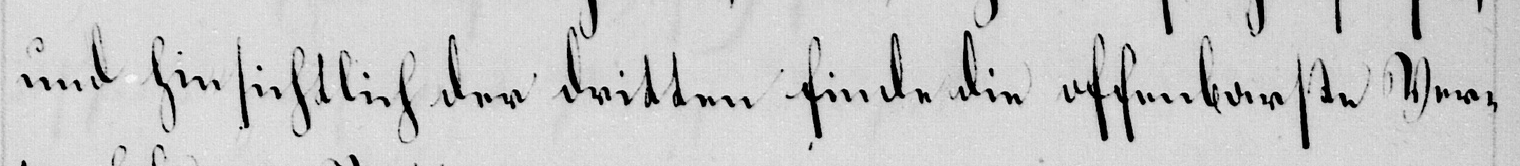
und hinsichtlich der dritten finde die offenbarste Ver¬
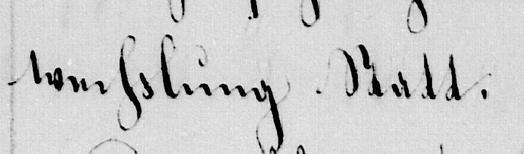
wechslung Statt.
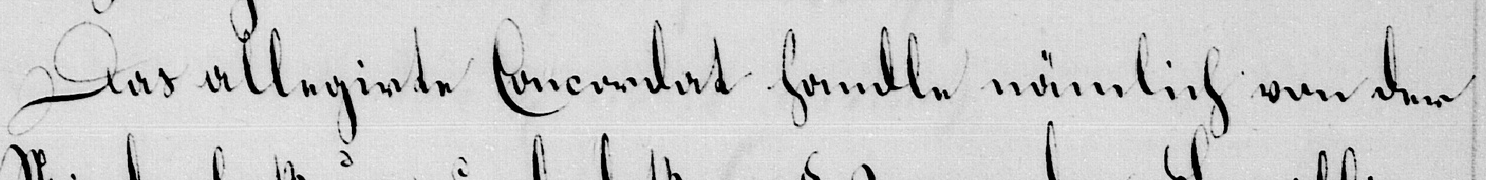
Das allegirte Concordat handle nämlich von der
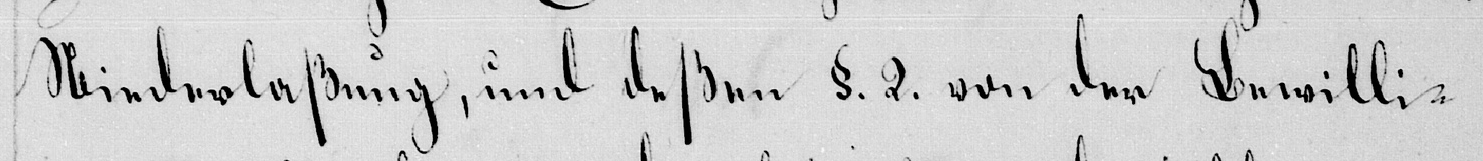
Niederlaßung, und deßen §. 2. von der Bewilli¬
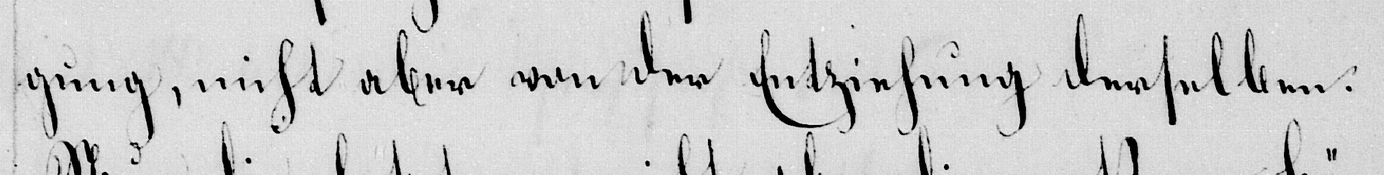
gung, nicht aber von der Entziehung desselben.
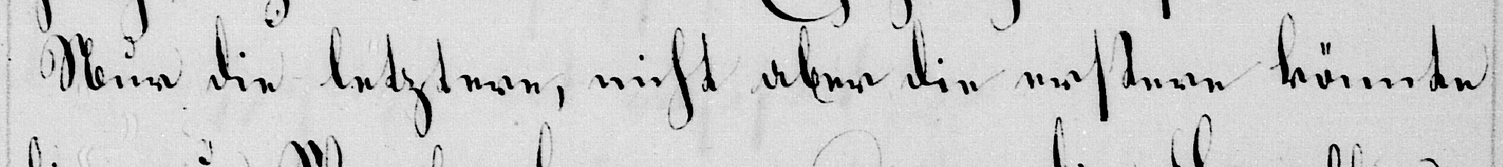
Nur die letztere, nicht aber die erstere könnte
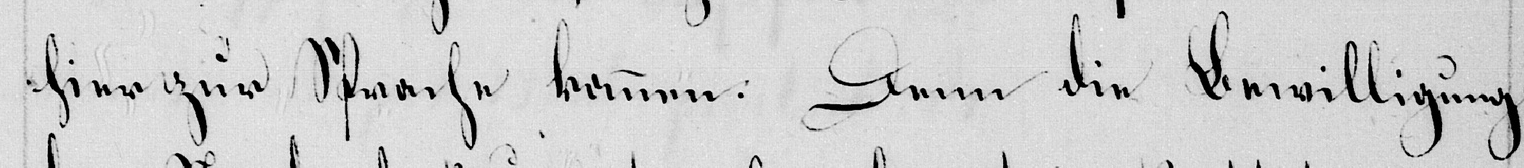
hier zur Sprache kommen. Denn die Bewilligung
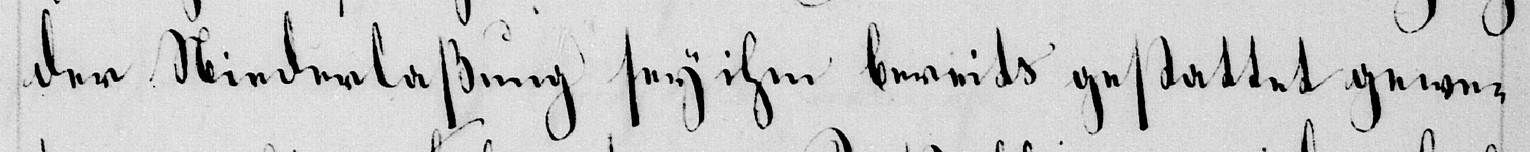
der Niederlaßung sey ihm bereits gestattet gewe¬
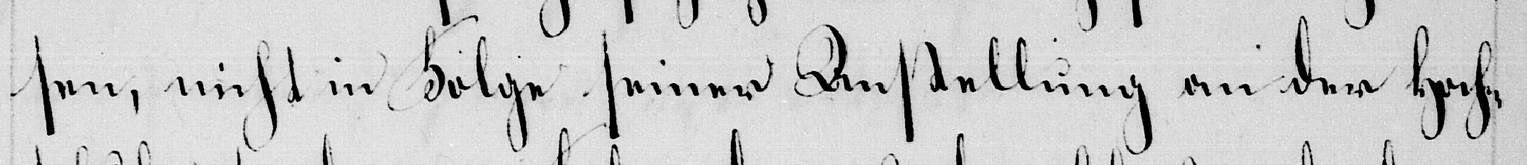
sen, nicht in Folge seiner Anstellung an der Hoch¬
